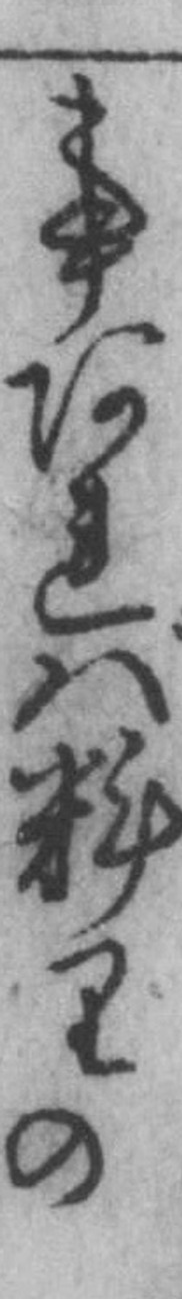事あれバ料りの
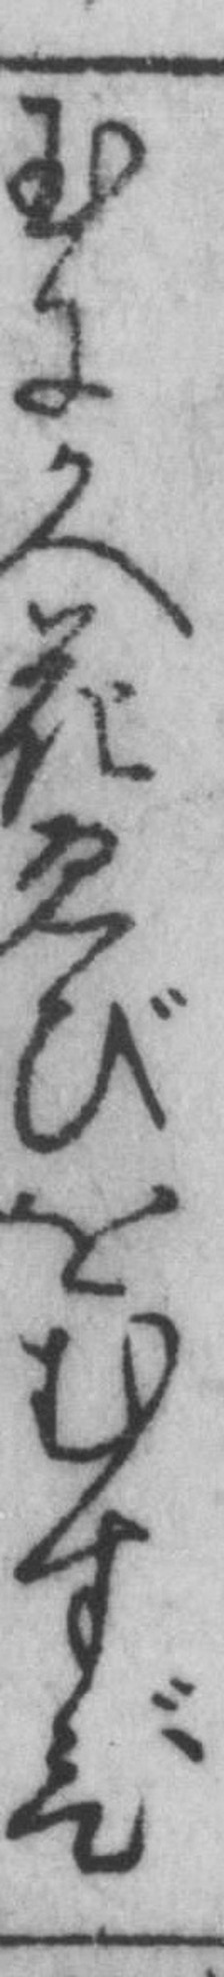玉にかへ花ゑびをむす
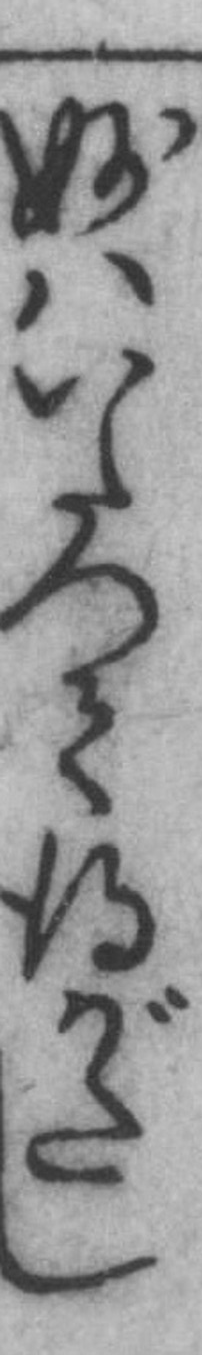妙ハいたつてがたし

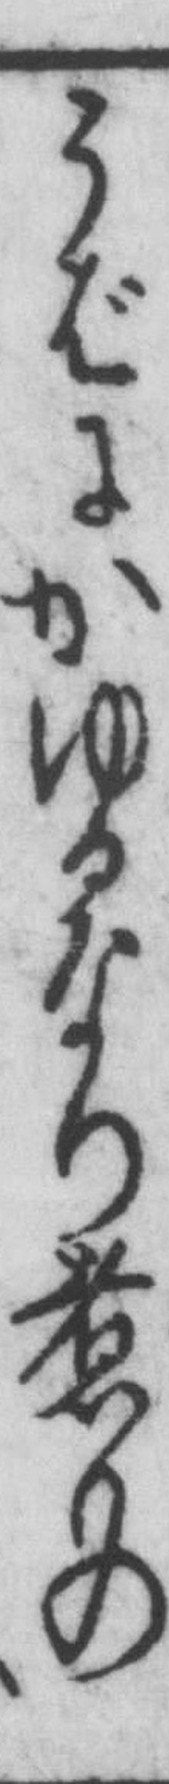かばにかゆるなり煮もの
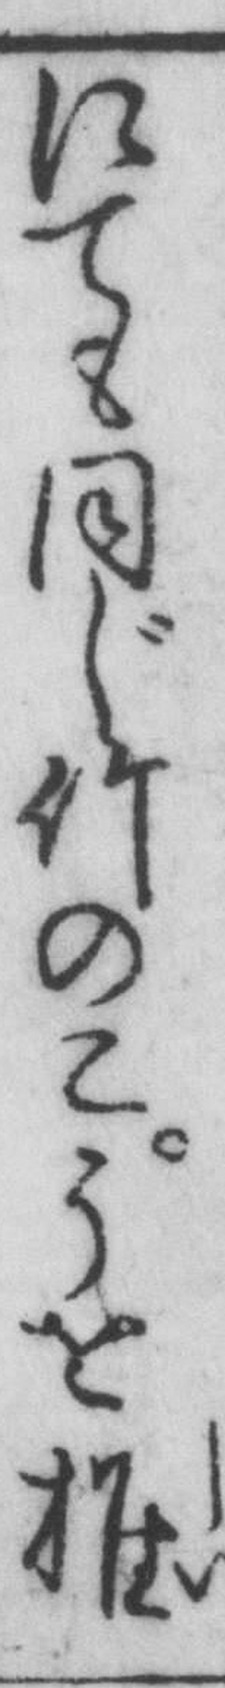にても同じ竹のこうを椎
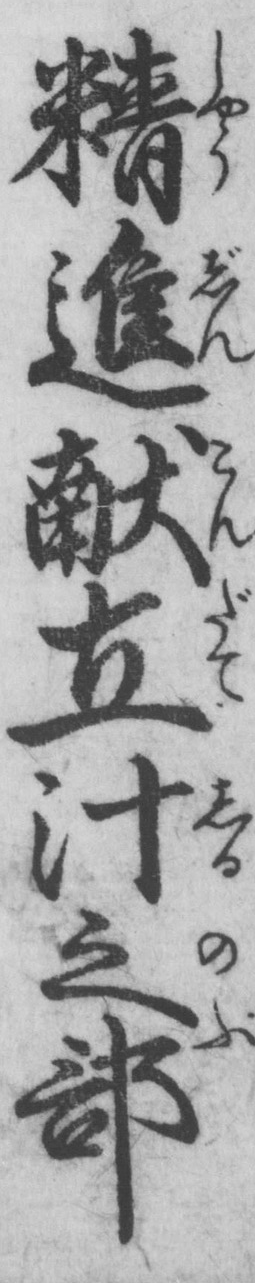精進献立汁之部
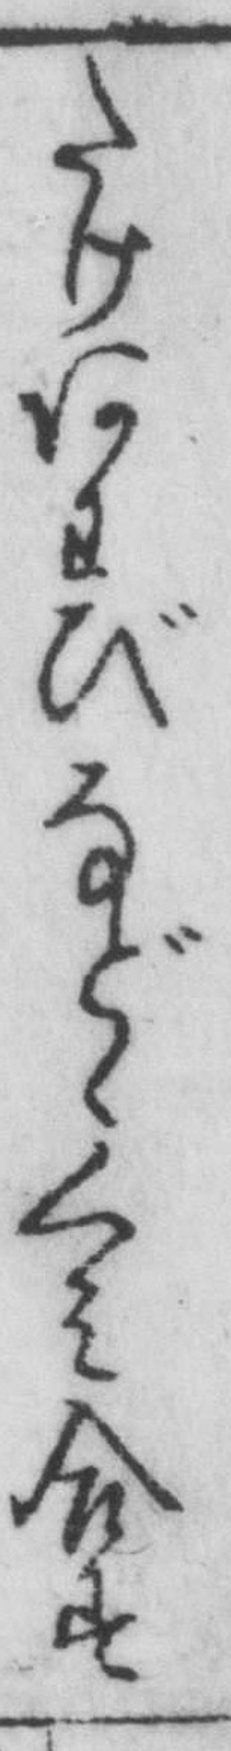たけあわびなどゝくミ合す
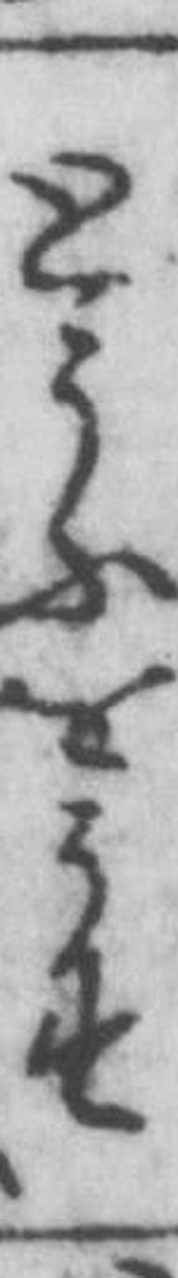とうふとうふ
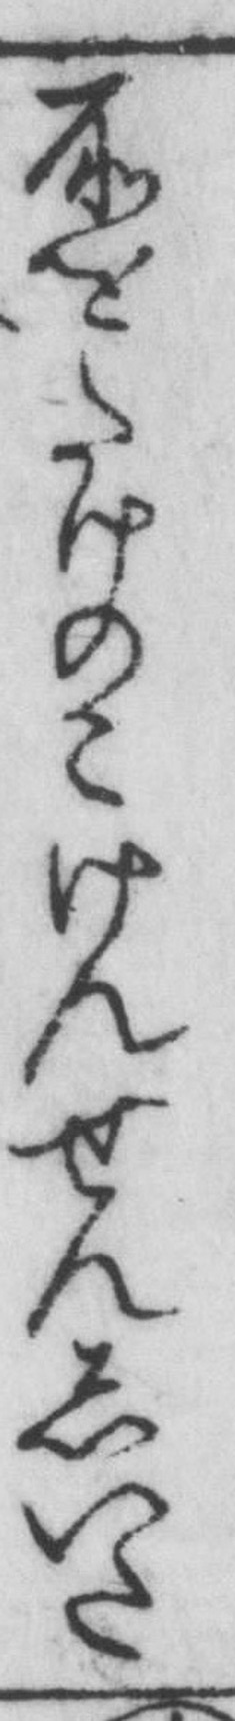所をたけのこけんせんしいた
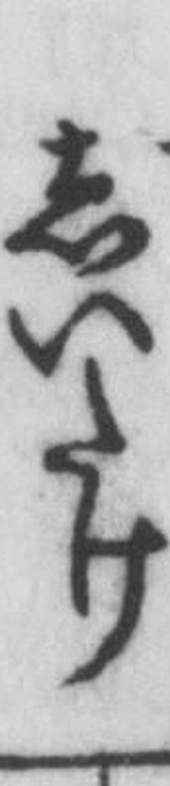しいたけ
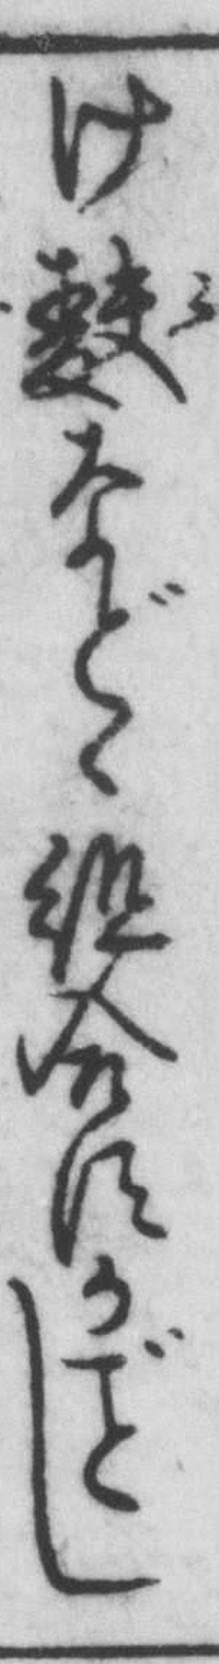け麩などゝ組合すごとし
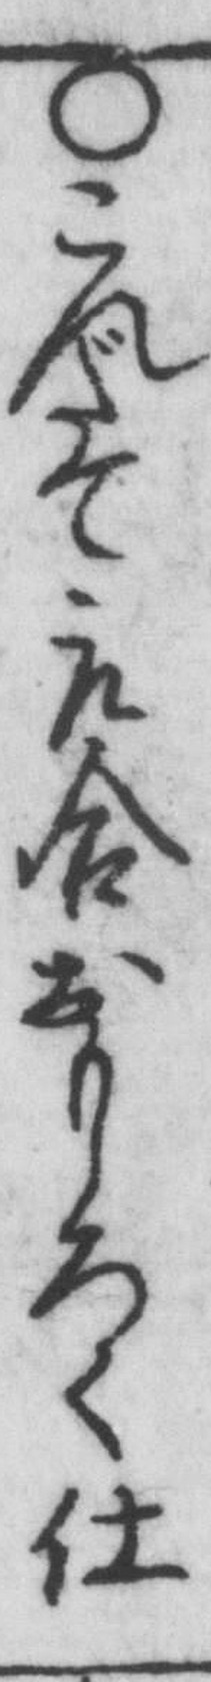〇こんだて取合おもしろく仕
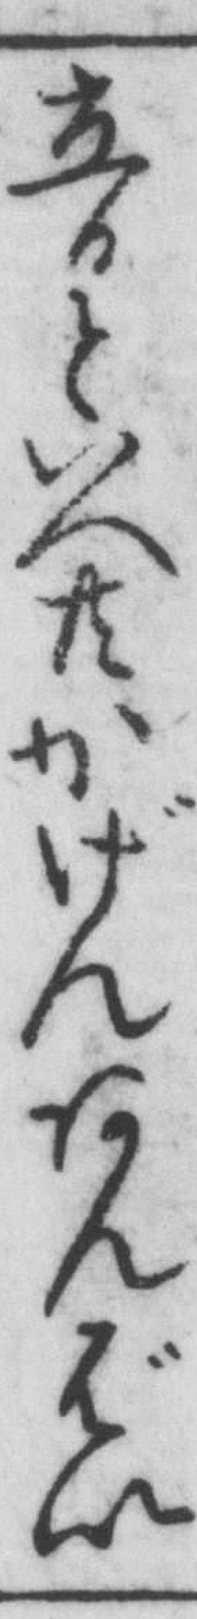立るといへ共かげんあんばい
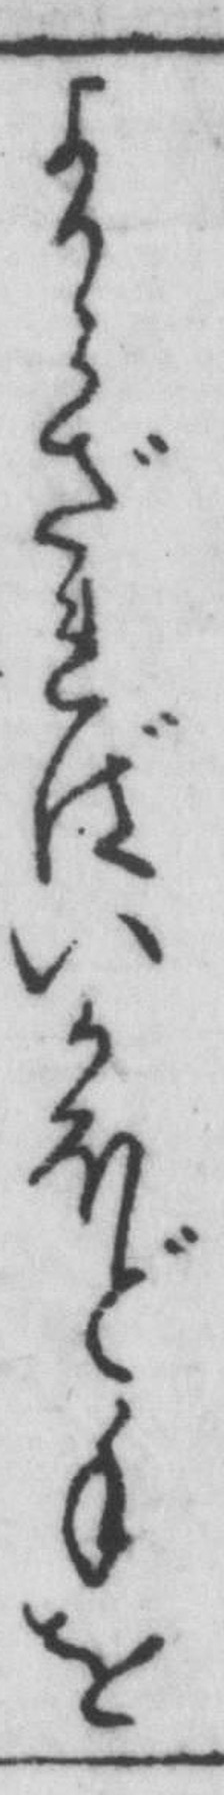よからざればいかほど手を
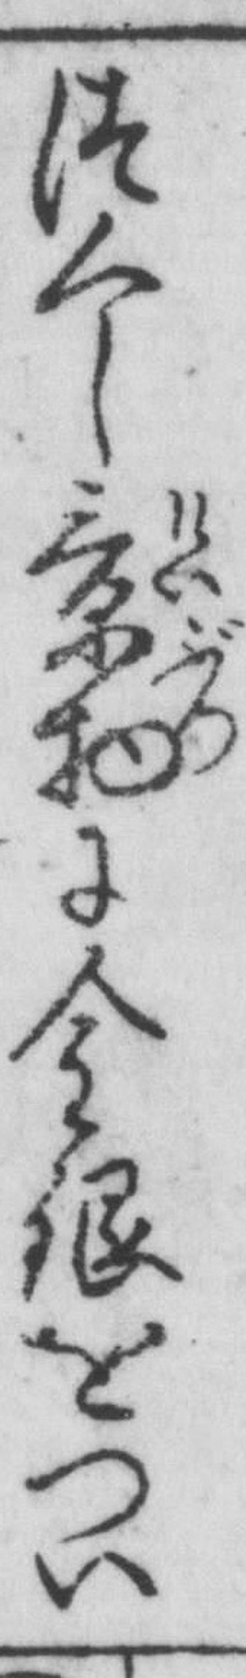つくし景物に金銀をつい
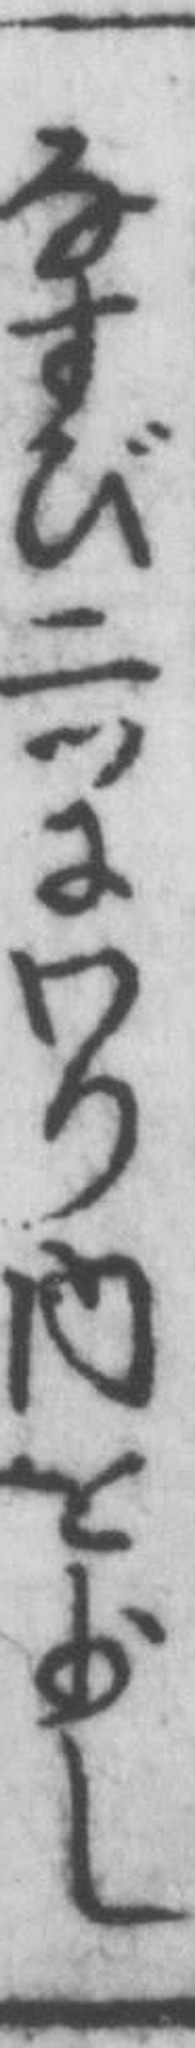なすび二ツにワり内を少し
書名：料理献立抄
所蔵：大阪府立大学学術情報センター 国文学研究資料館
